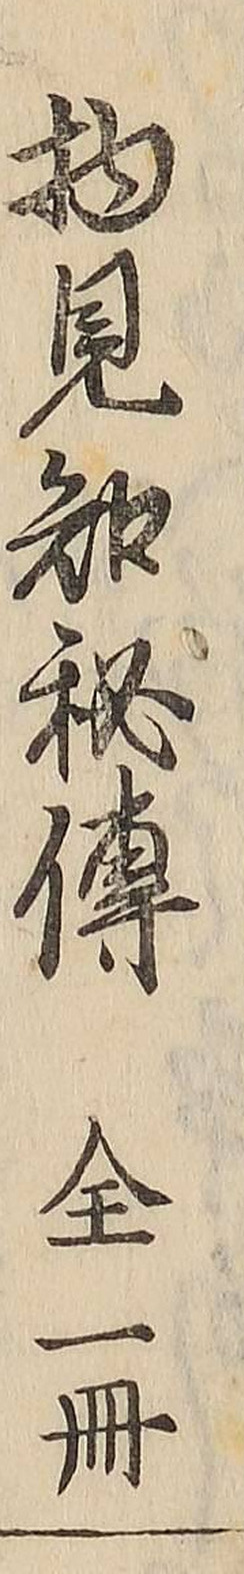物見知秘伝全一冊
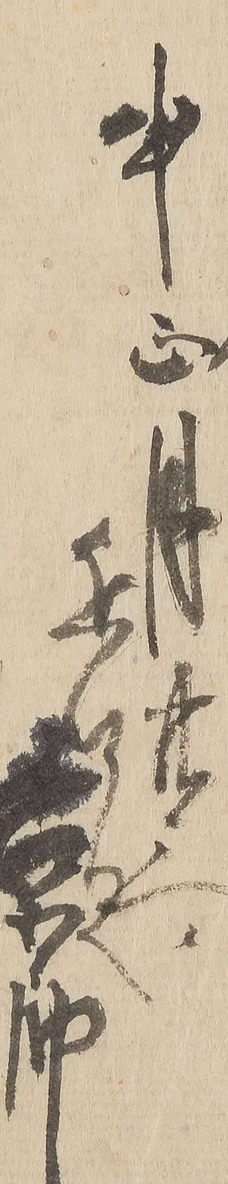申正月廿三日
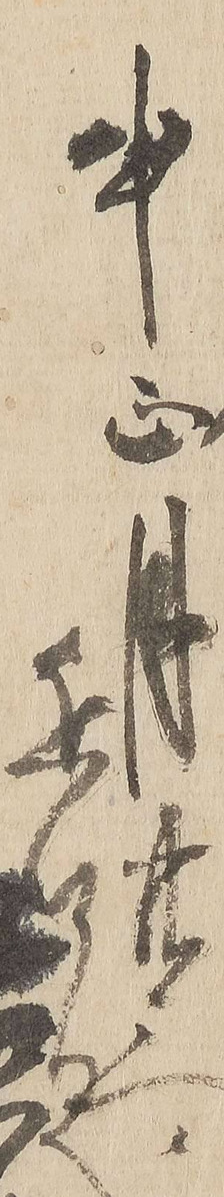申正月廿三日
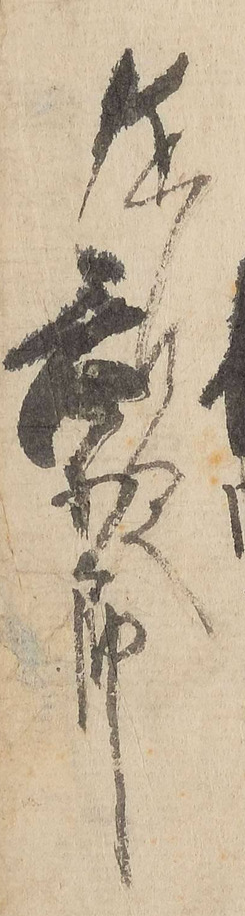善五郎
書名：物覺秘傳
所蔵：神戸大学附属図書館 国文学研究資料館
